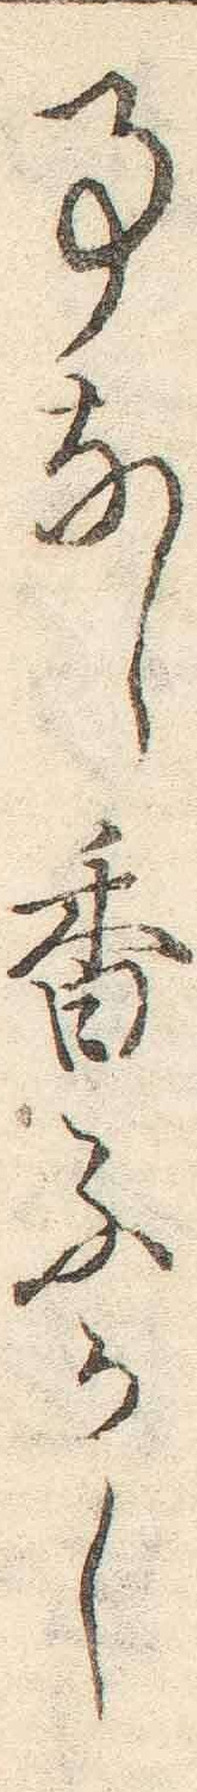事なし香ふかし
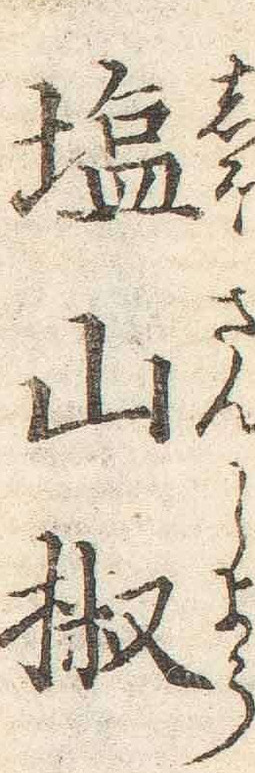塩山椒
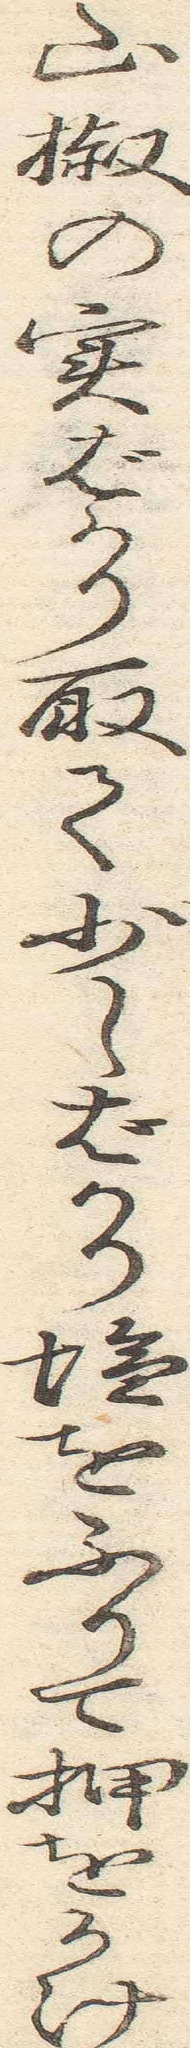山椒の実ばかり取て少しばかり塩をふりて押をかけ
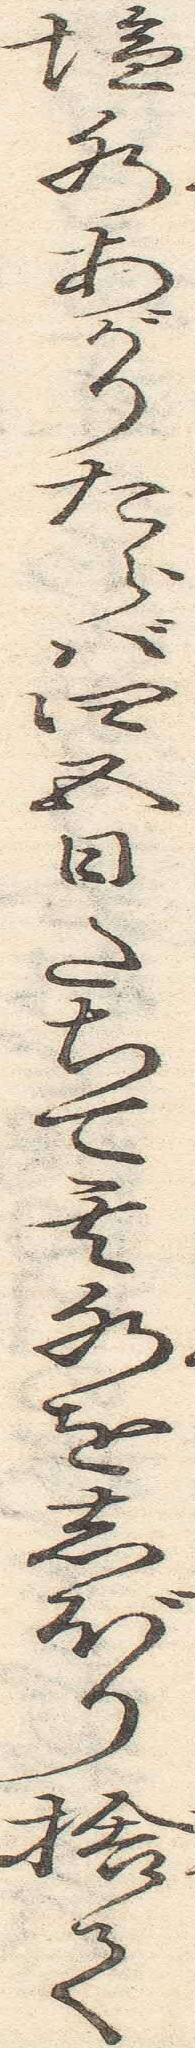塩水あがりたらば四五日たちて其水をしぼり捨て
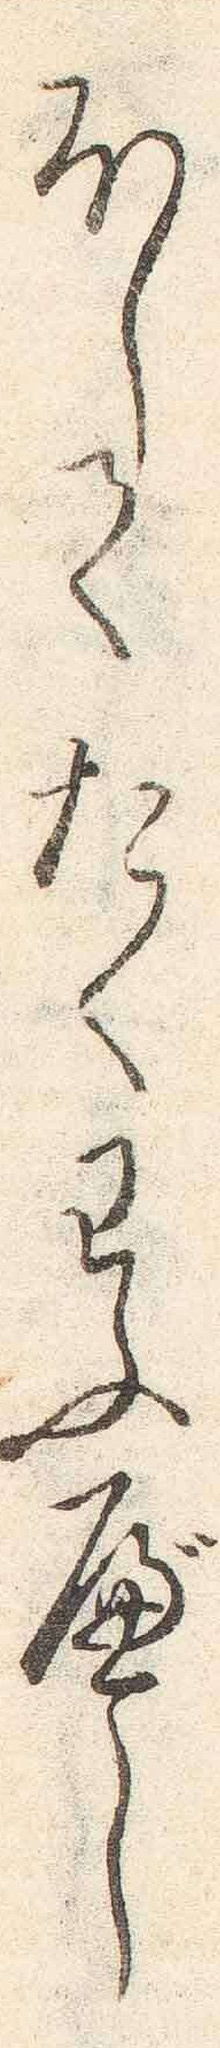ほしてたくわふべし
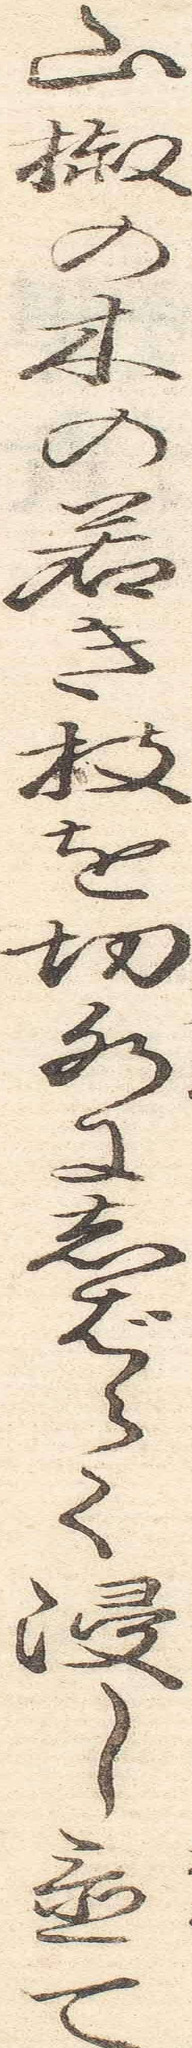山椒の木の若き枝を切水にしばらく浸し置て
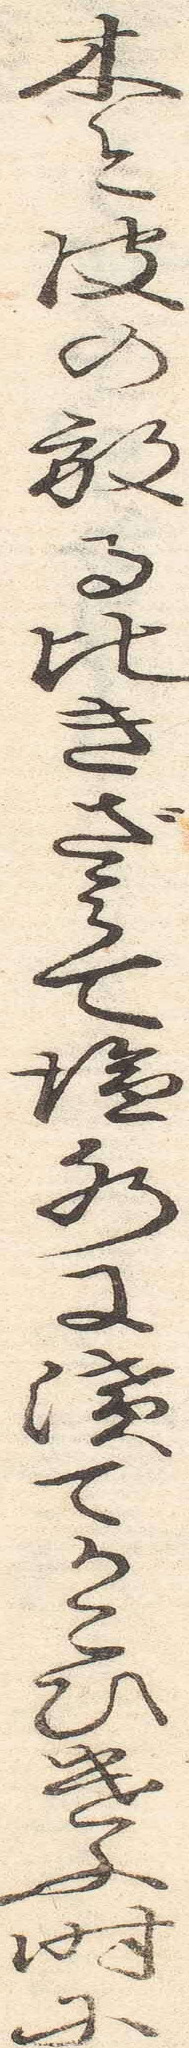木と皮の放る比きざみて塩水に漬てかこひ遣ふ時に
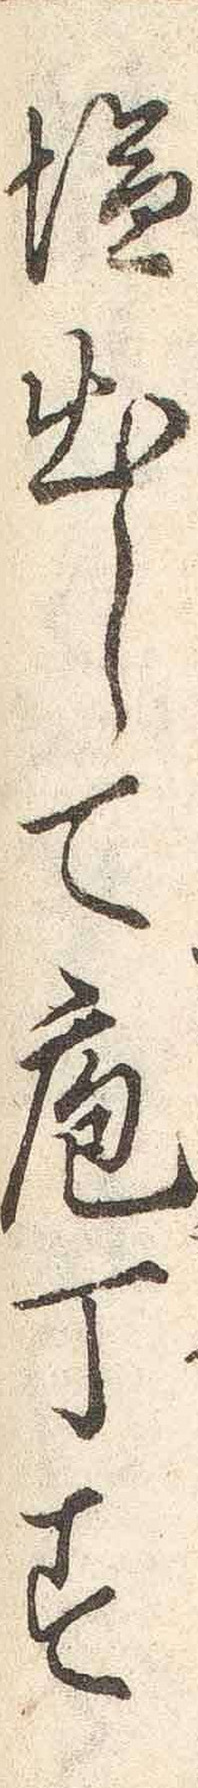塩出して庖丁す
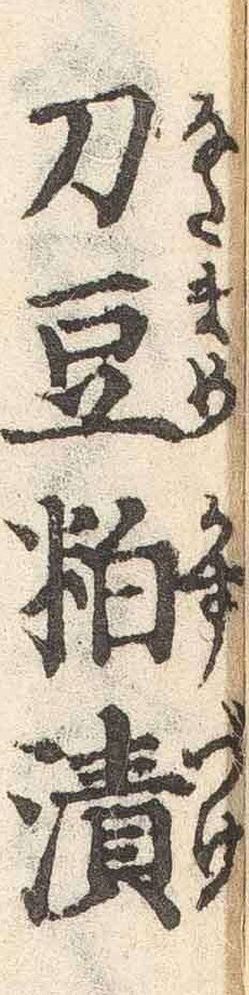刀豆粕漬
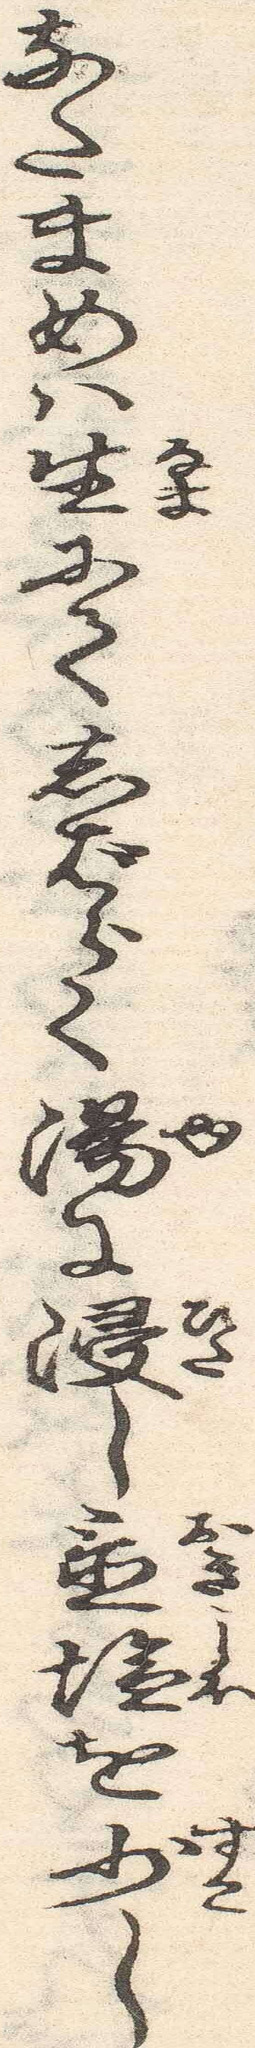なたまめは生にてしばらく湯に浸し置塩を少し
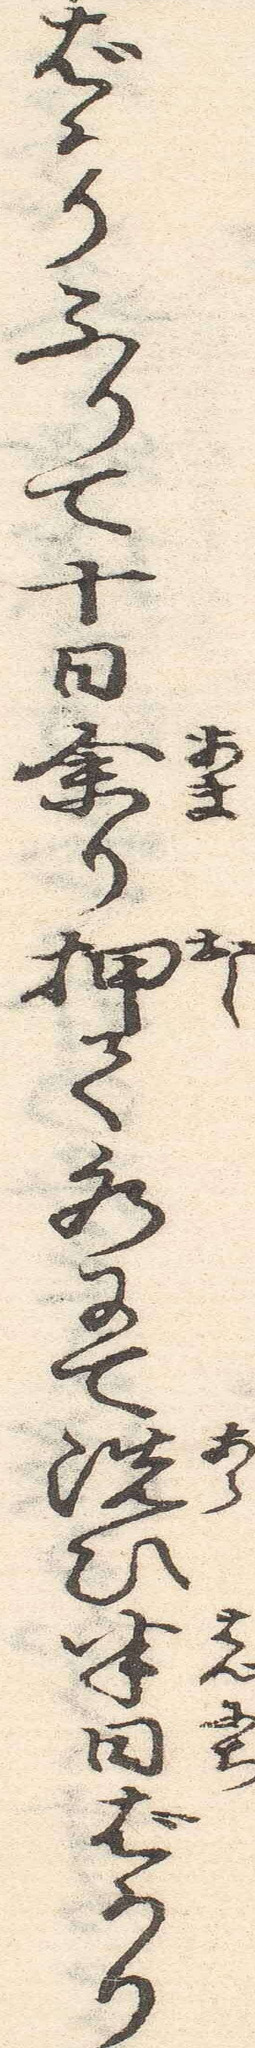ばかりふりて十日余り押て水にて洗ひ半日ばかり
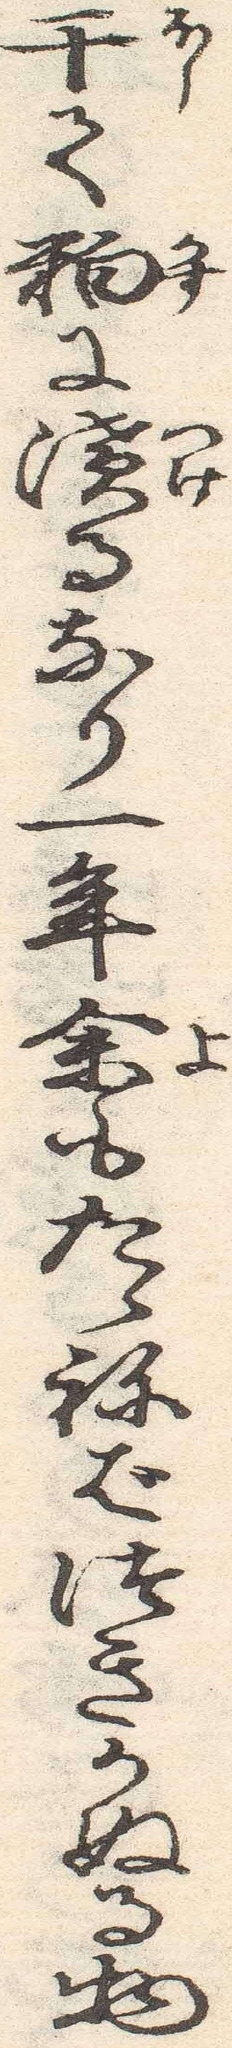干て粕に漬るなり一年余もたゝねばつきかぬる物
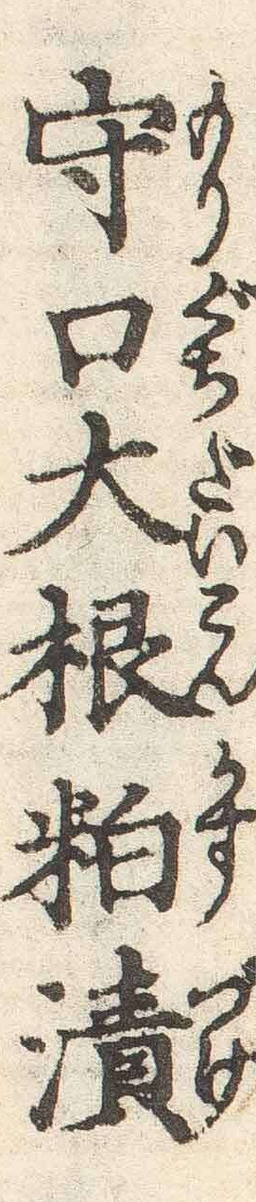守口大根粕漬
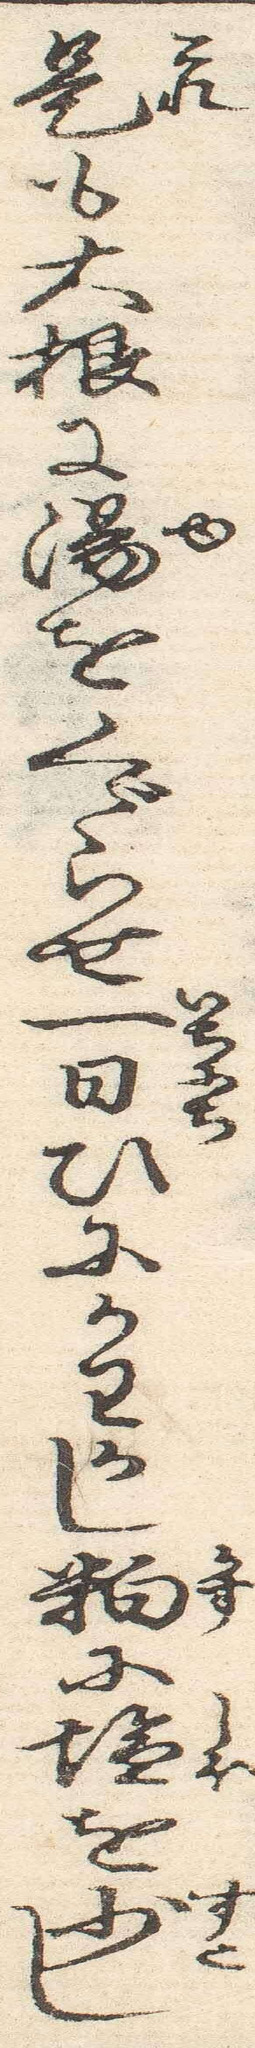是も大根に湯をくぐらせ一日ひにかわかし粕に塩を少し
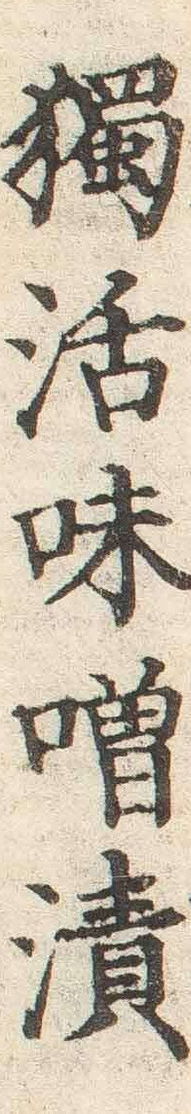独活味噌漬

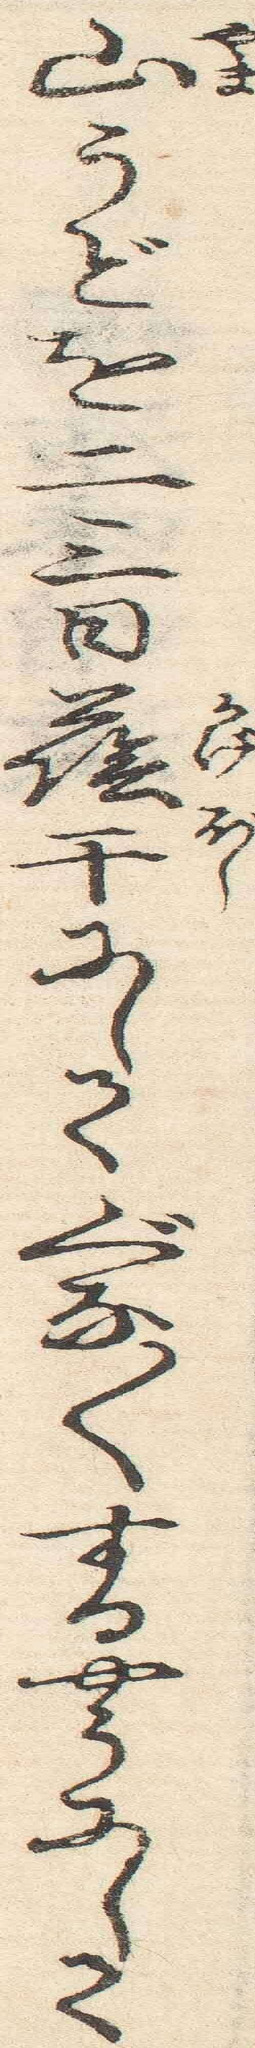山うどを二三日蔭干にしてぐな〳〵するやふにして
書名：四季漬物塩嘉言
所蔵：東京学芸大学附属図書館 国文学研究資料館
